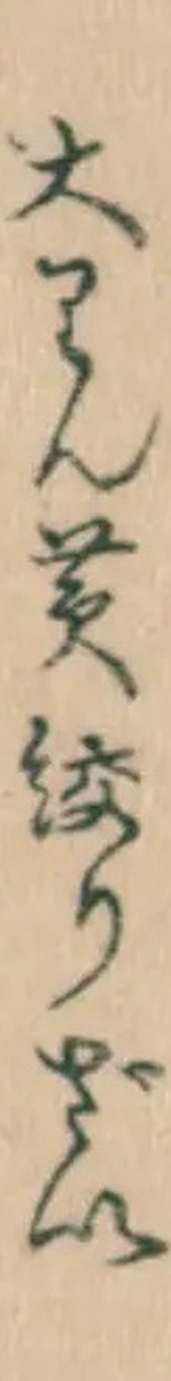大りん黄絞りざい
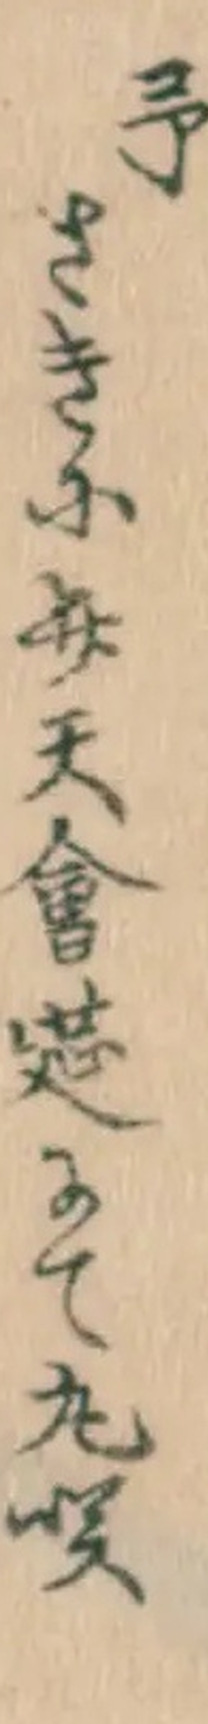さきに弁天会莚にて丸咲
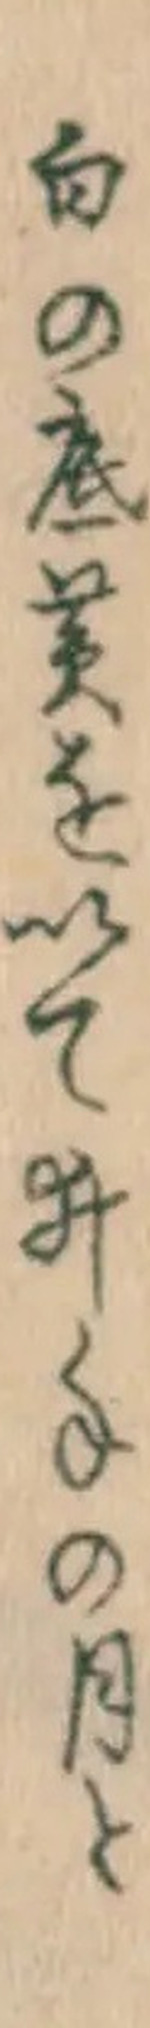白の底黄を以て井手の月と
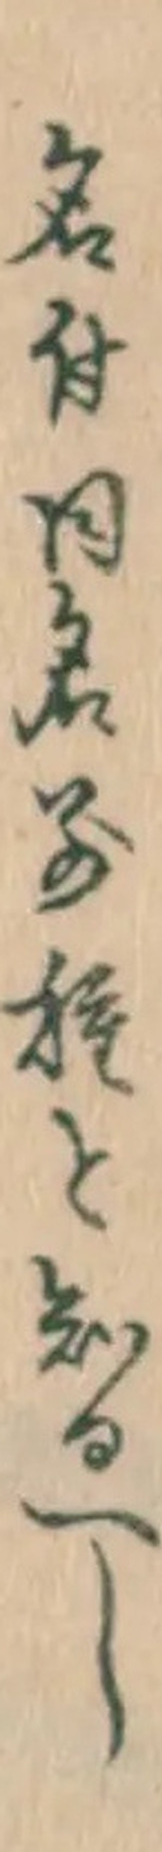名付同名別種と知るへし

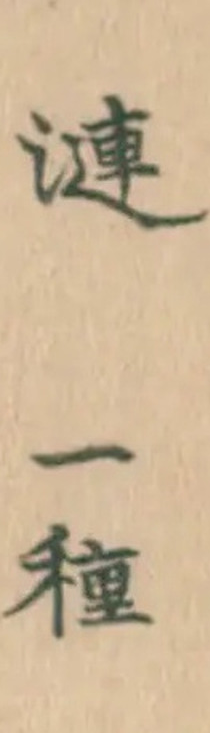漣一種
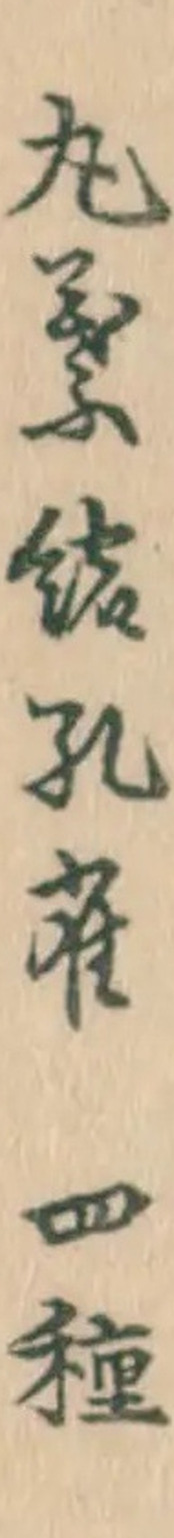丸葉縮孔雀四種
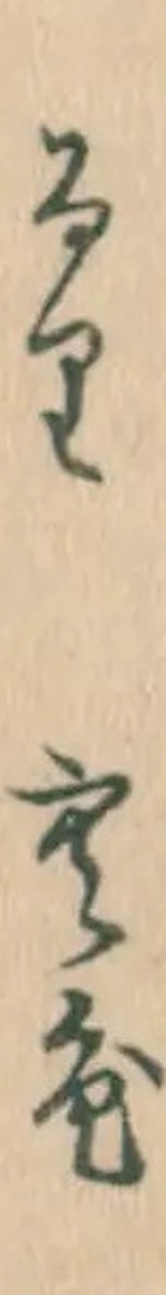るり空色

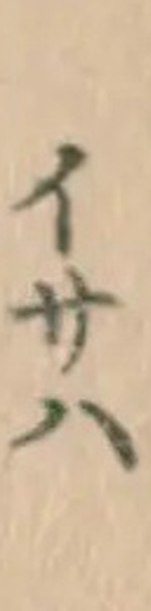イサハ
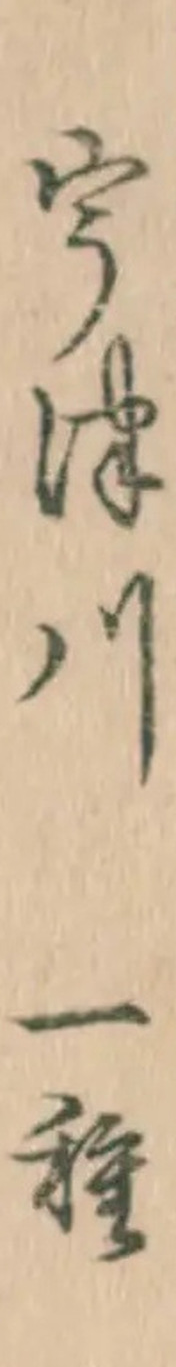宇津川一種
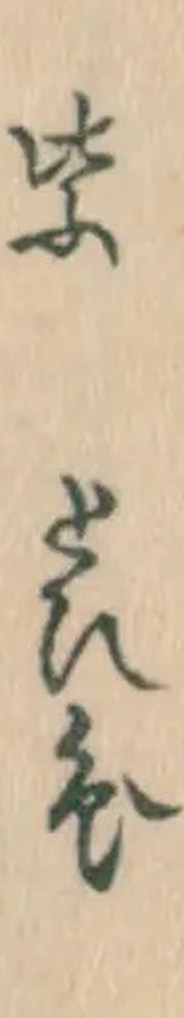紫とひ色

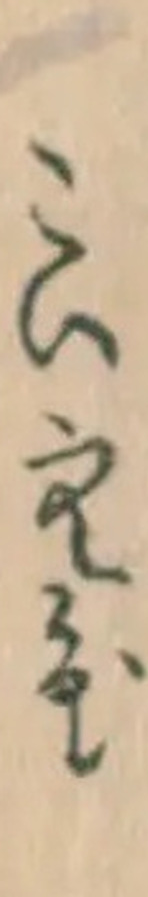こい空色
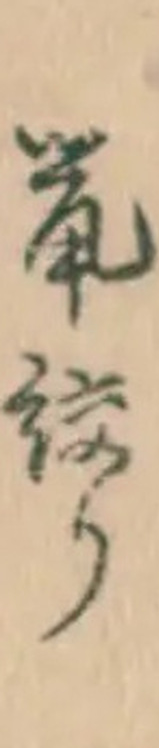鼠絞り
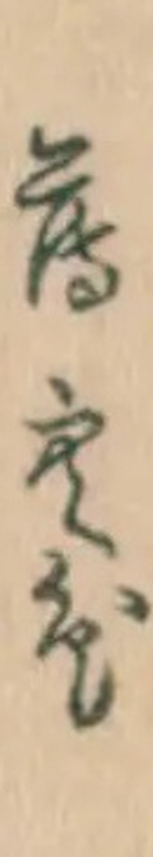薄空色
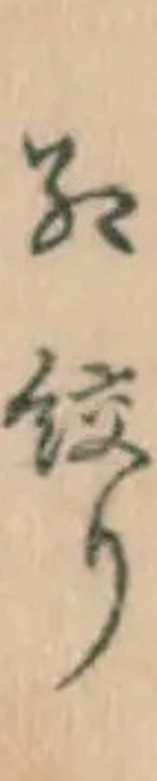紅絞り
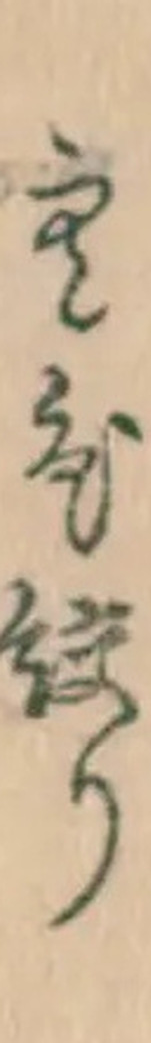空色絞り
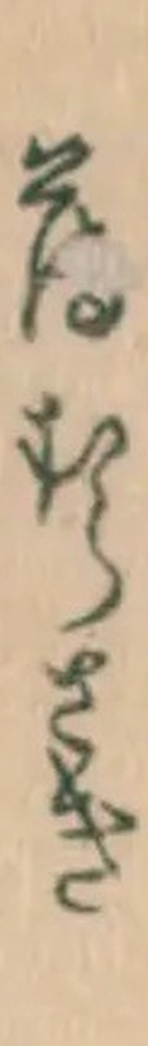薄むらさき
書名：朝顔叢. 上巻
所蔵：国立国会図書館 National Diet Library, JAPAN
